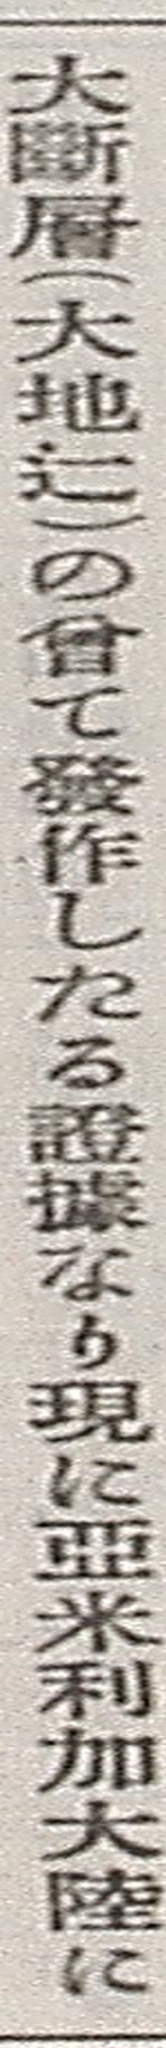大断層の曾て発作したる証拠なり現に亜米利加大陸に
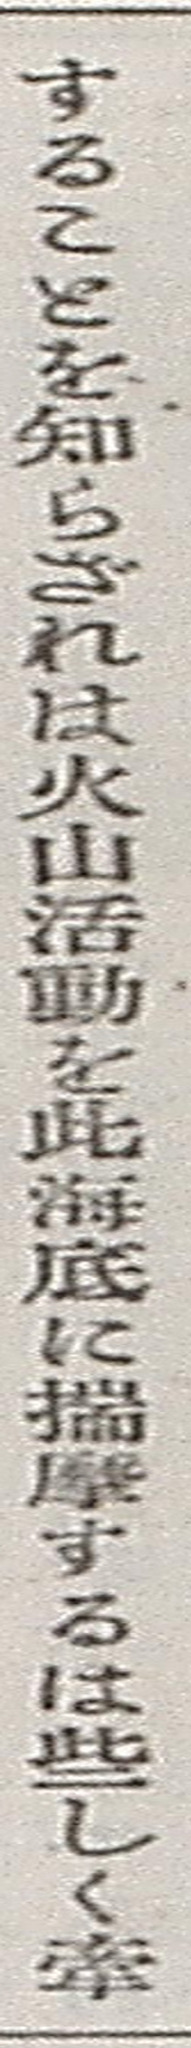することを知らざれは火山活動を此海底に揣摩するは些しく牽
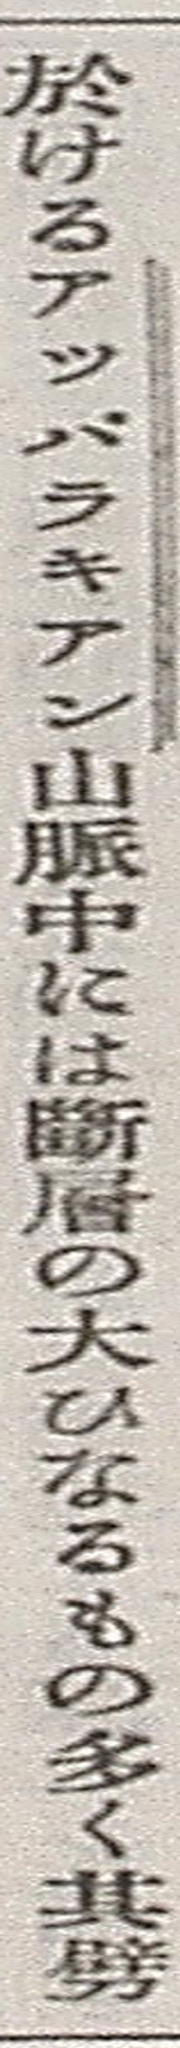於けるアッパラキアン山脈中には断層の大ひなるもの多く其劈
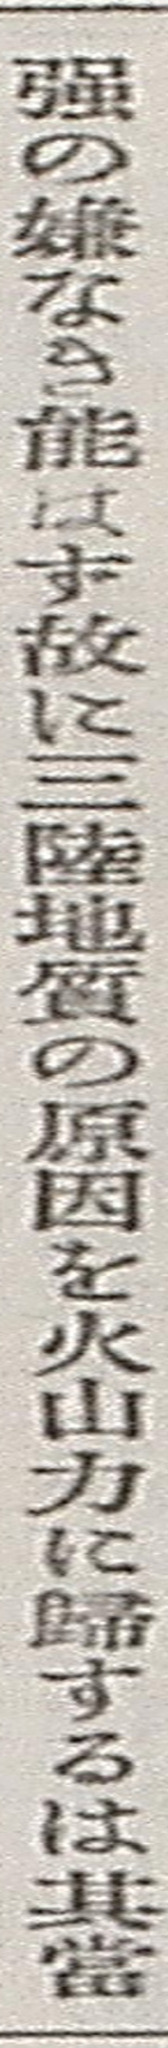強の嫌なき能はず故に三陸地質の原因を火山力に帰するは其当
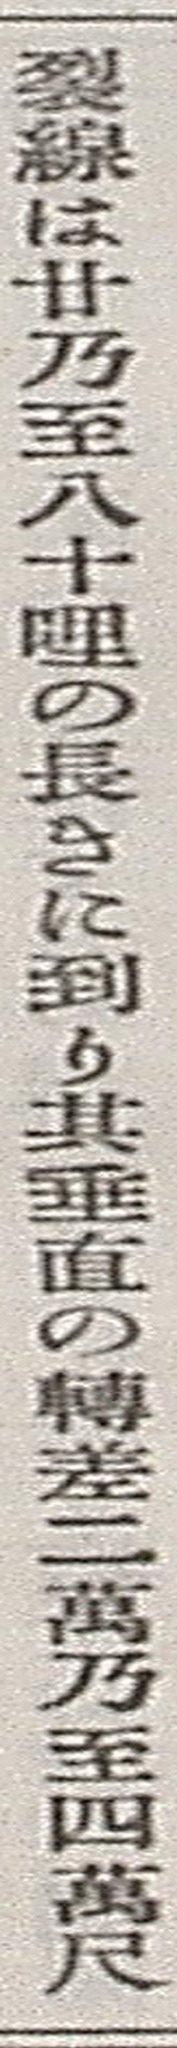裂線は廿乃至八十哩の長さに到り其垂直の転差二万乃至四万尺
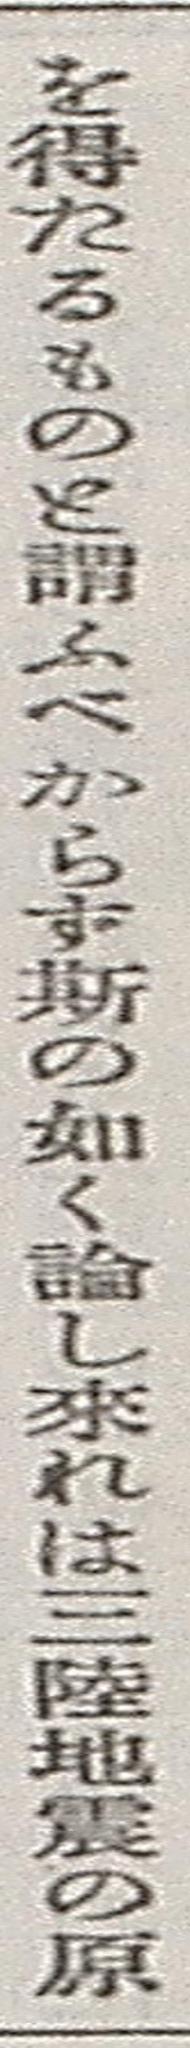を得たるものと謂ふべからず斯の如く論し来れは三陸地震の原
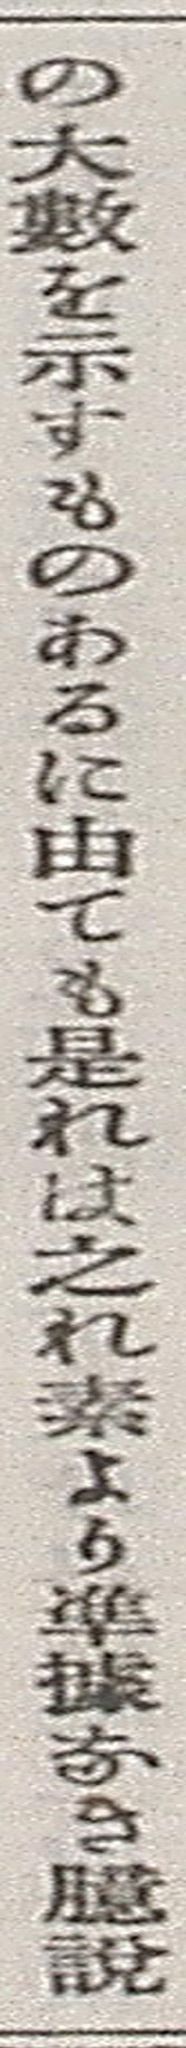の大数を示すものあるに由ても是れは之れ素より準拠なき臆説
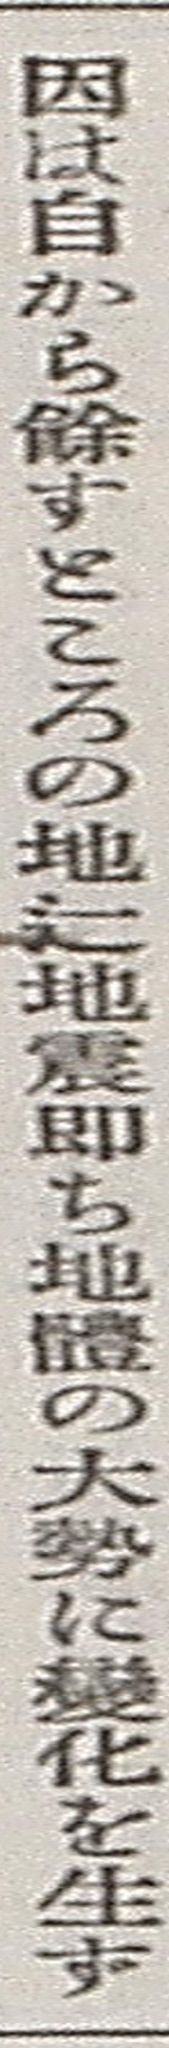因は自から余すところの地辷地震即ち地体の大勢に変化を生ず
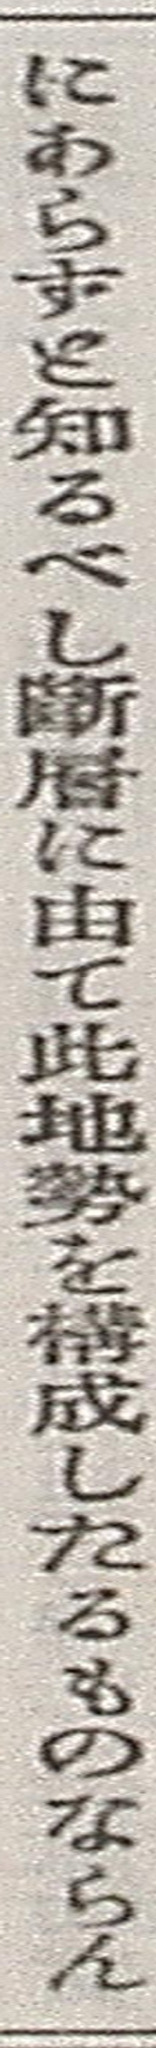にあらずと知るべし断層に由て此地勢を構成したるものならん
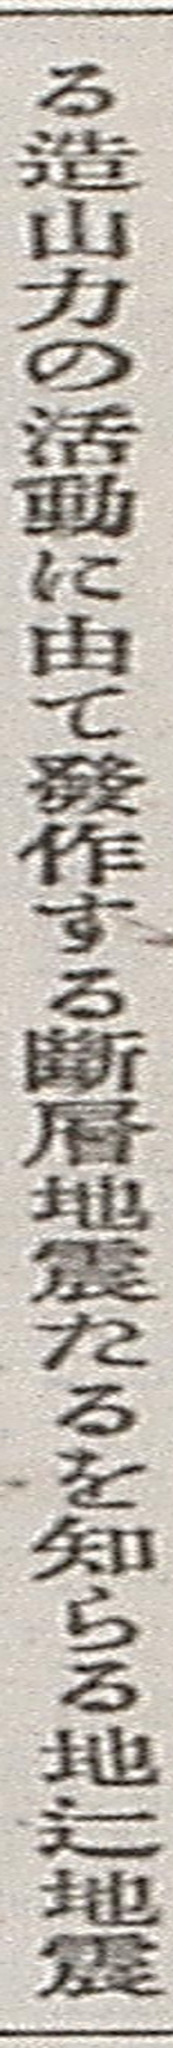る造山力の活動に由て発作する断層地震たるを知らる地辷地震
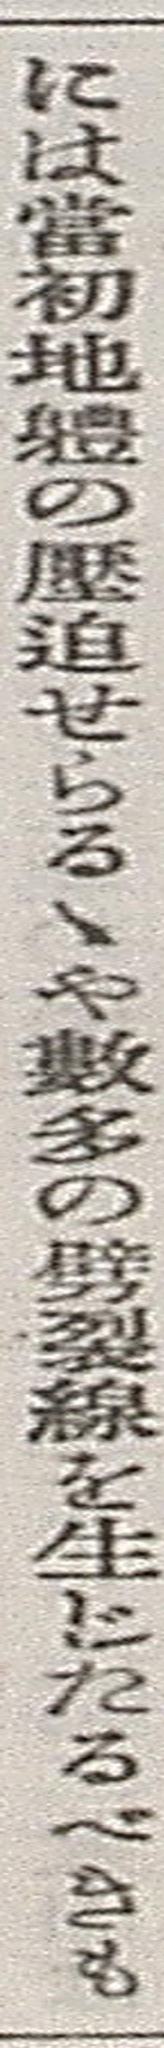には当初地体の圧迫せらるゝや数多の劈裂線を生じたるべきも
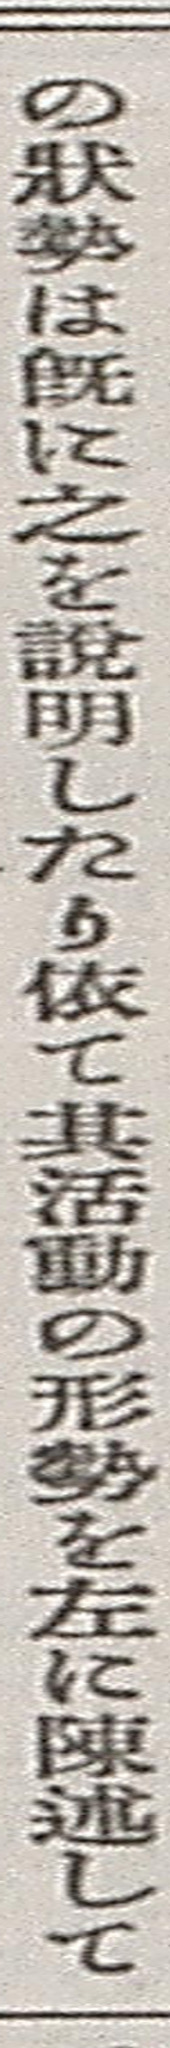の状勢は既に之を説明したり依て其活動の形勢を左に陳述して
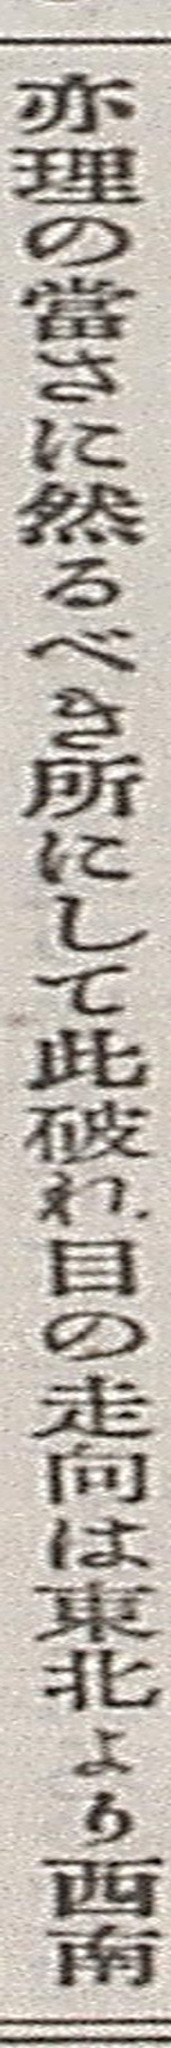亦理の当さに然るべき所にして此破れ目の走向は東北より西南
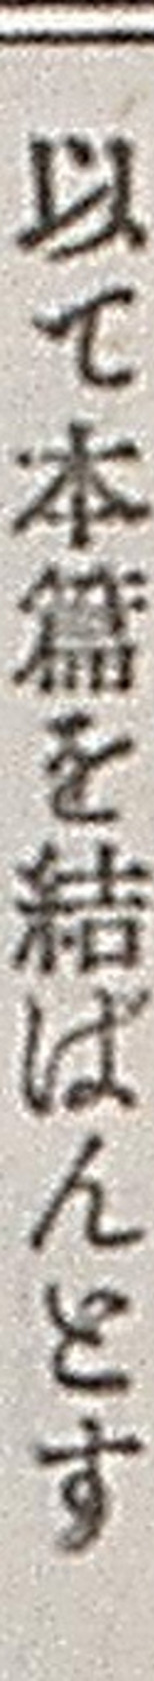以て本篇を結ばんとす
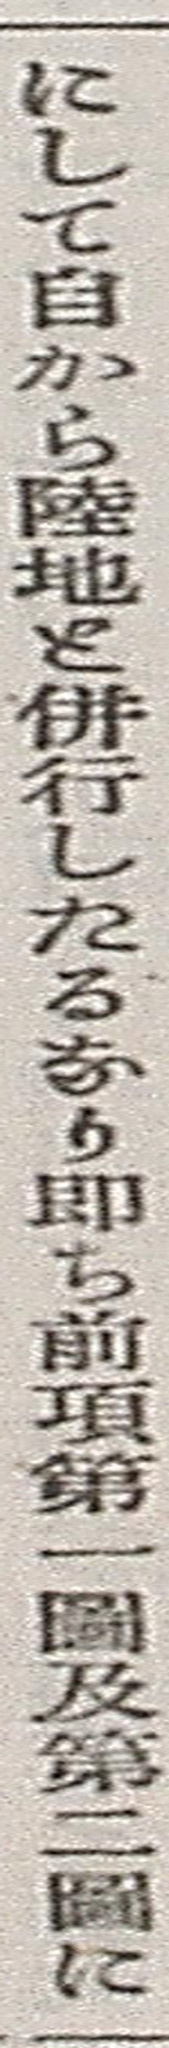にして自から陸地と併行したるなり即ち前項第一図及第二図に
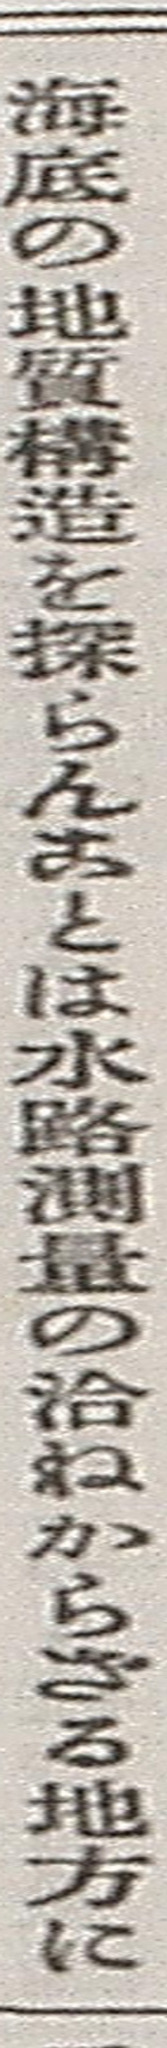海底の地質構造を探らんことは水路測量の洽ねからざる地方に
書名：風俗畫報臨時増刊第百二十號　大海嘯被害録（下）
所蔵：東京大学地震研究所図書室 Earthquake Research Institute Library, The University of Tokyo, JAPAN
